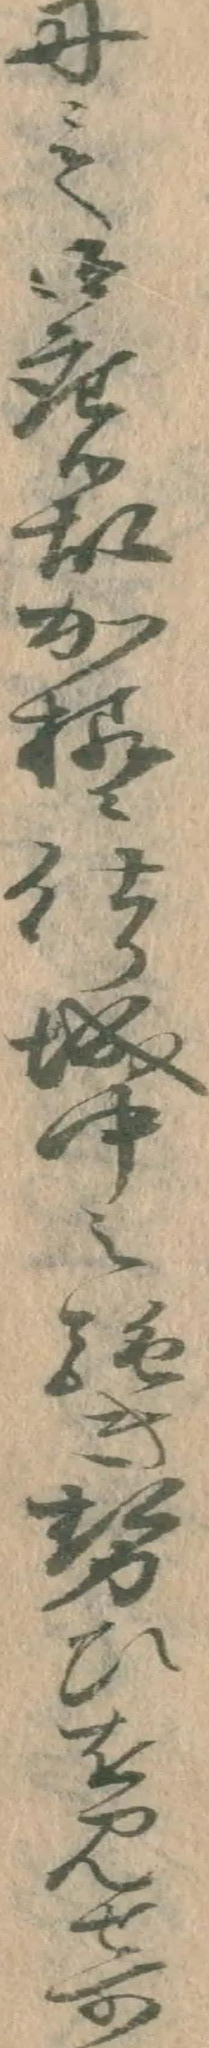丹にて御座候故か様に仕り城中之強き勢ひを見せ可
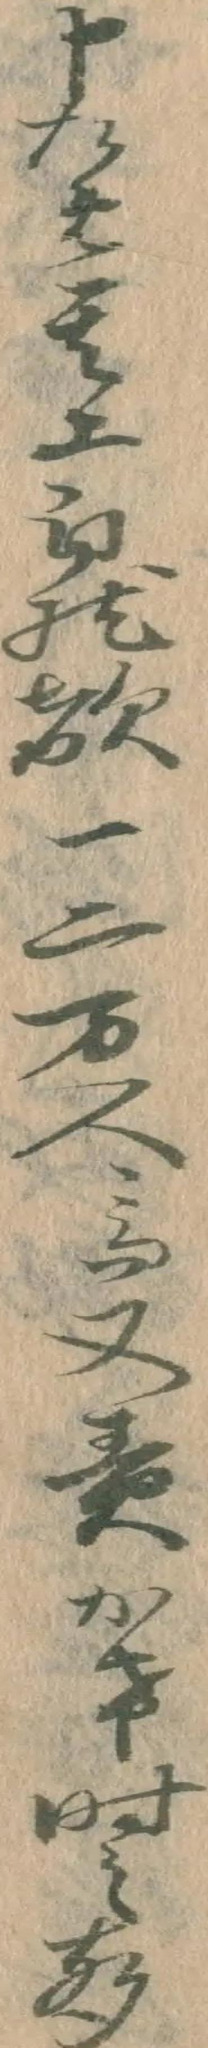申ため其上自然敵一二万人にて又責かけ時之声
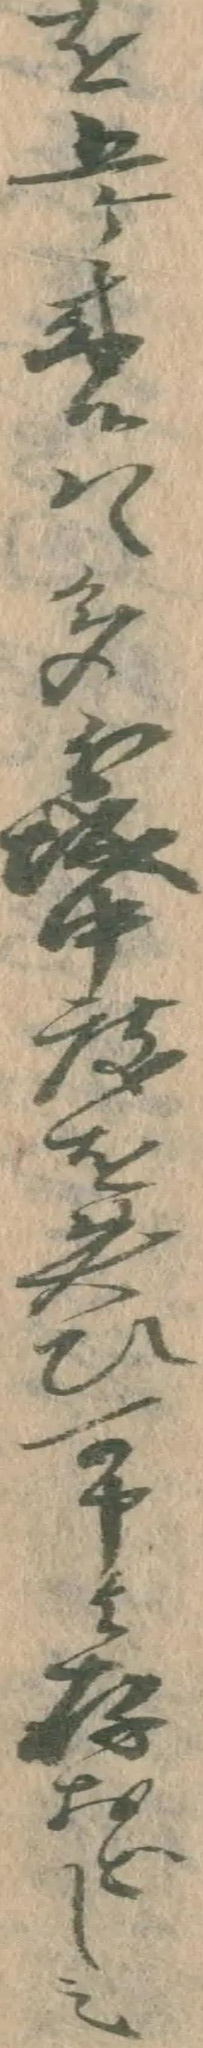を上ケ来候はゝ多分城中度を失ひ可申と存おとし之
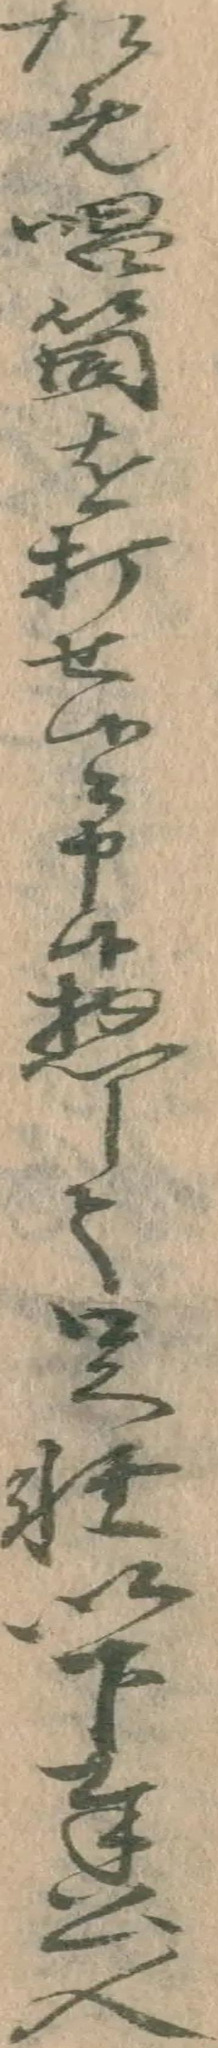ため唱筒を打せ候と申候惣して足軽以下奉公人
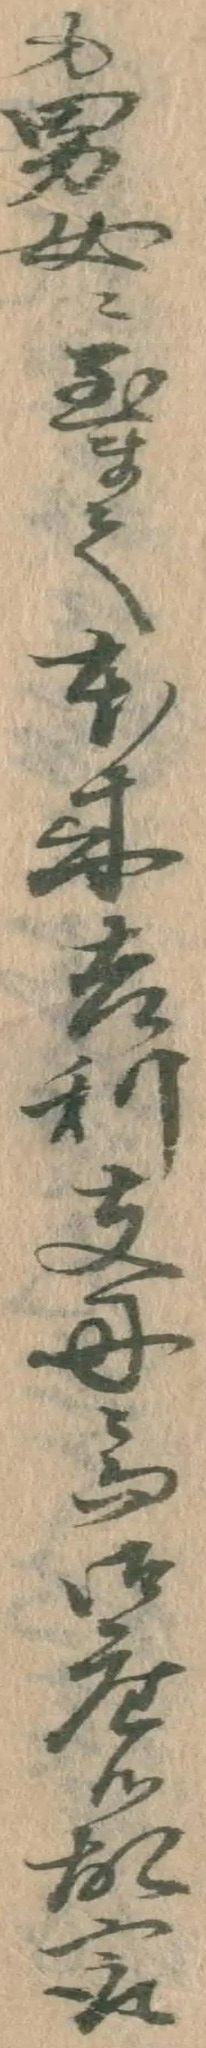も男女に至まて本来吉利支丹に而御座候故最
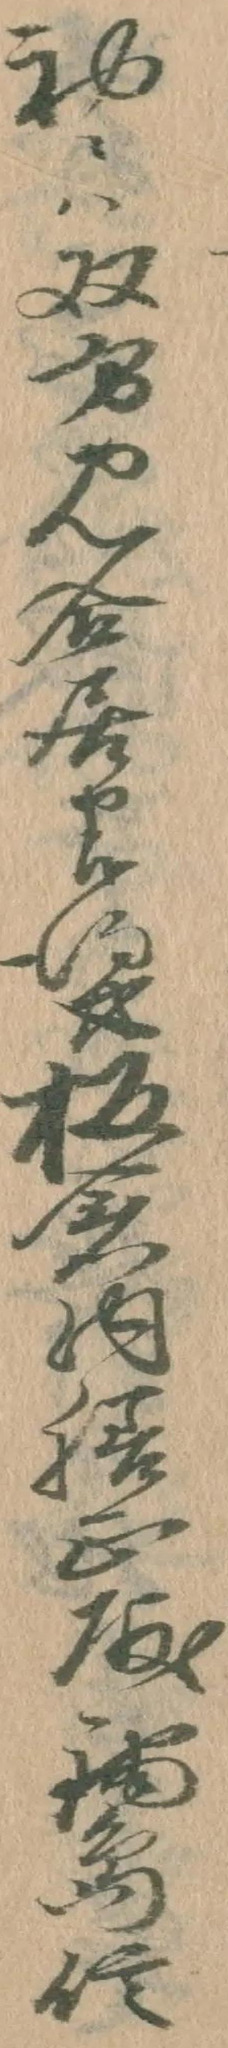初には双方見合居申候得共板倉内膳正殿福島信
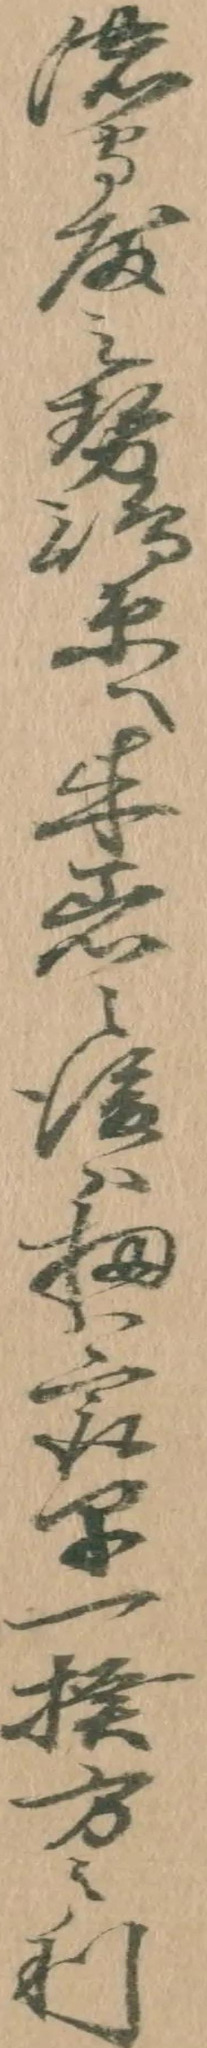濃守殿之勢島原へ来着之後は扨は最早一揆方之利
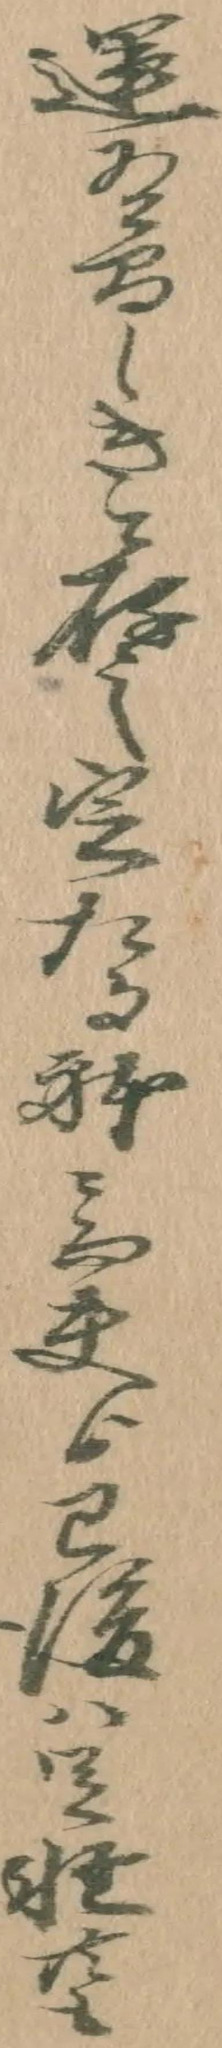運有間しきに存之定たる体に而夫ゟ已後は足軽共も
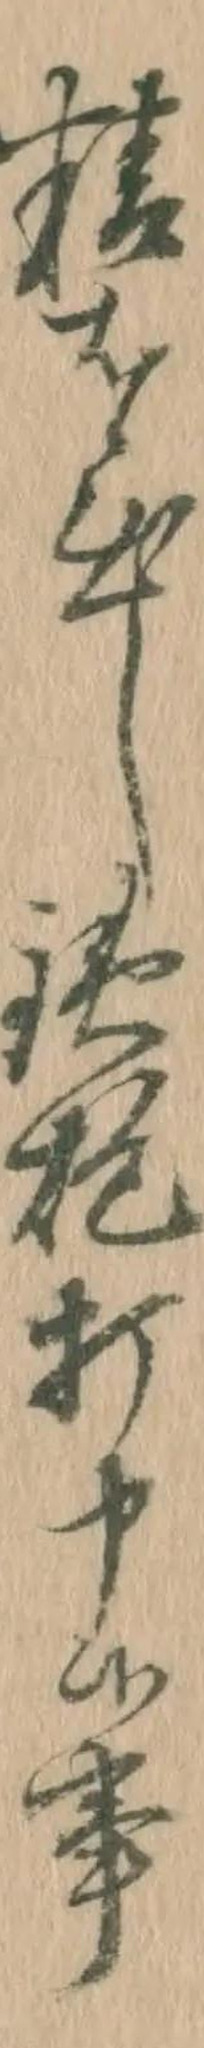精を出し鉄炮打申候事
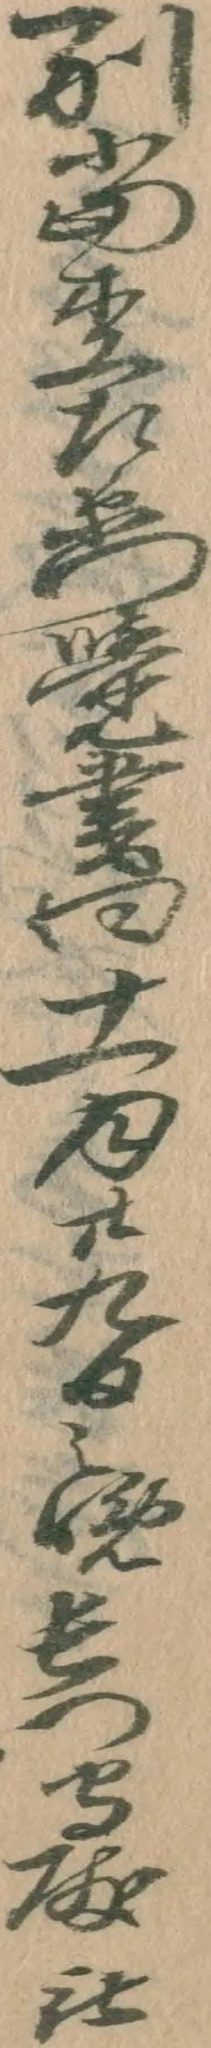別当杢左衛門覚書曰十一月廿九日之晩長門守殿被
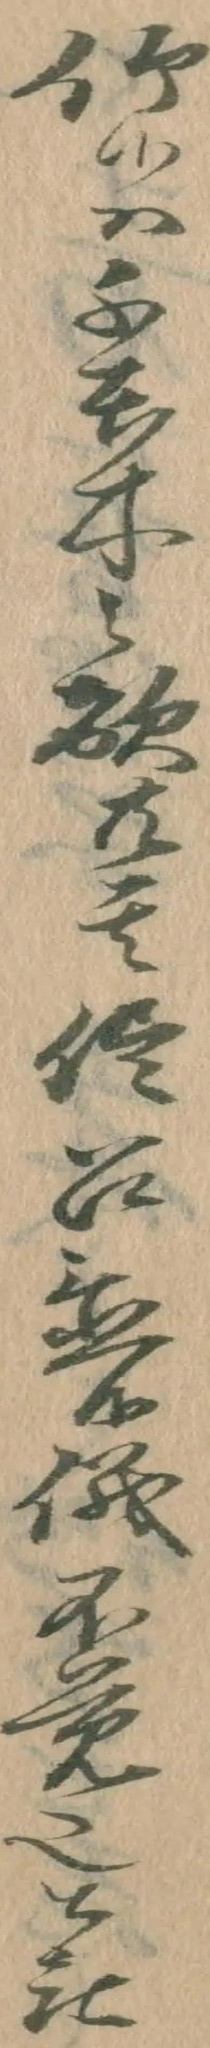仰候は千本木之敵共其儘召置候儀不覚也と被
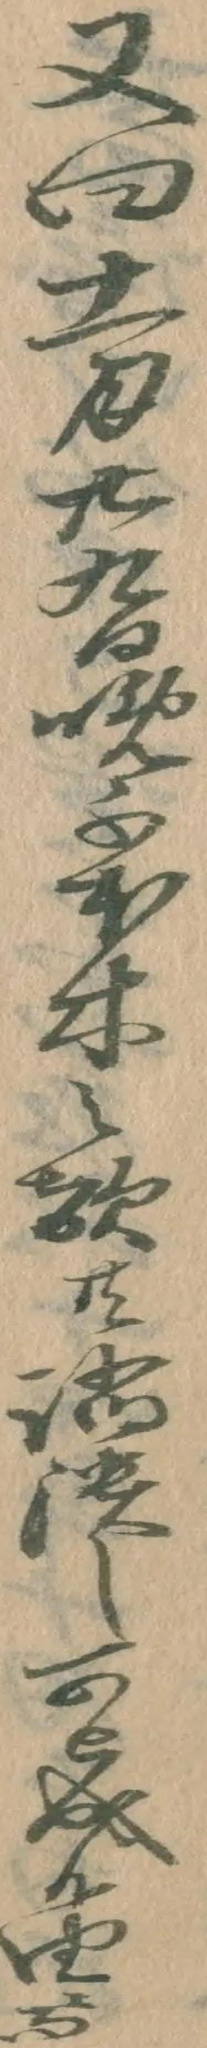又曰十一月廿九日晩千本木之敵共踏潰し可被成候由に而
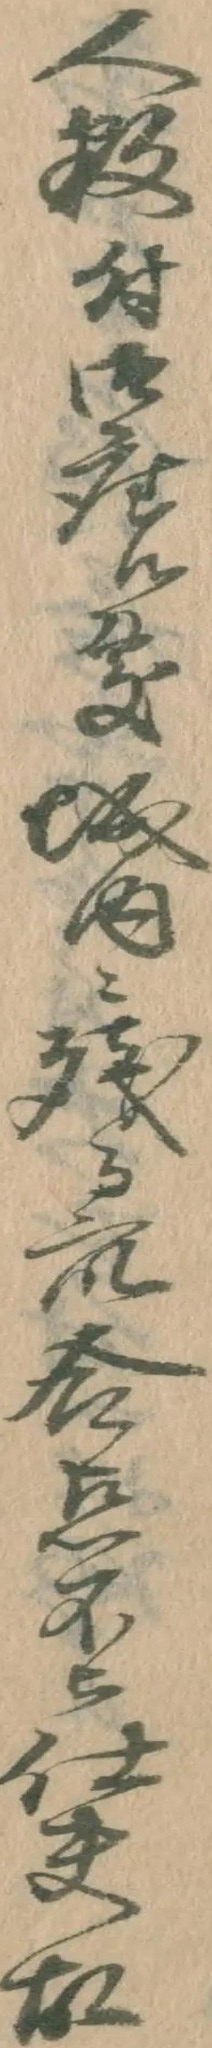人数付御座候処城内に残る衆合点不被仕夫故
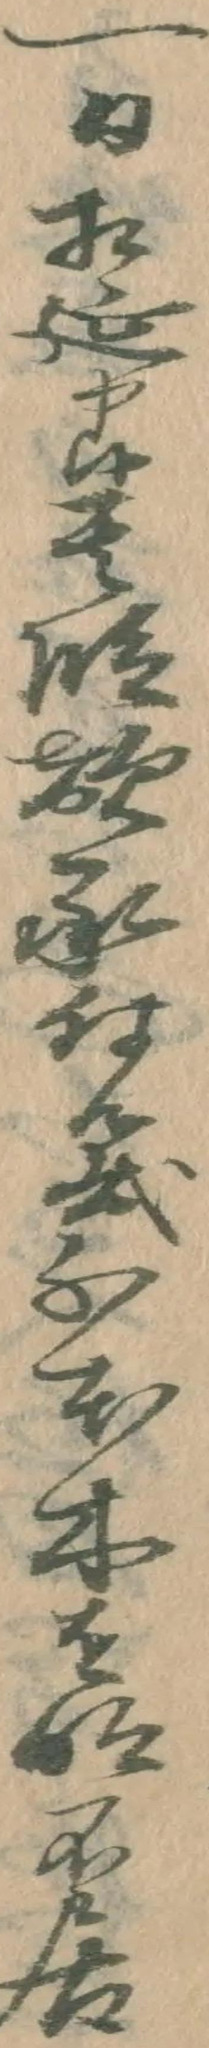一日相延申候其段敵承付候哉千本木を明不居
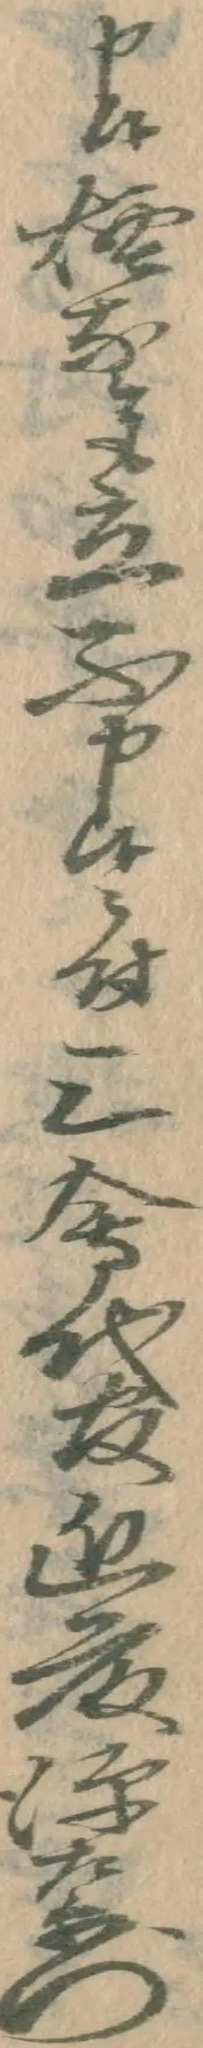申候煙なとも立不申候に付三会代官進藤源左衛門

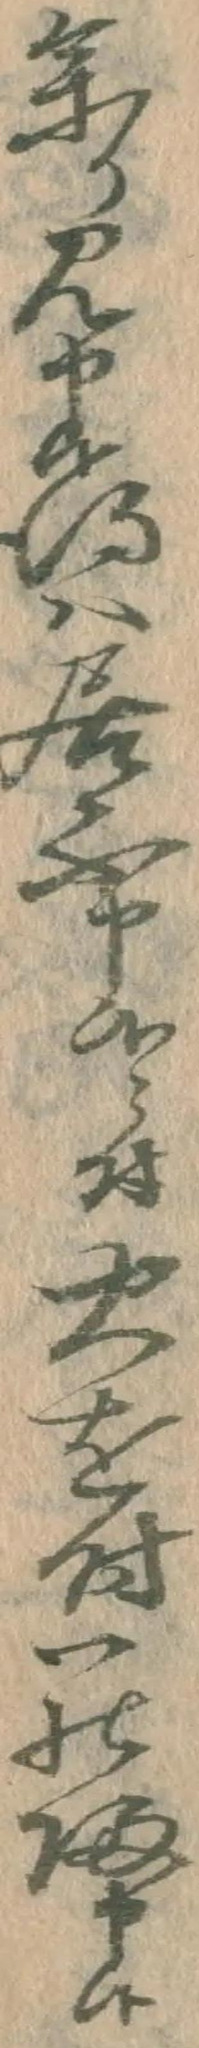参り見申候得は居不申候に付火を付罷帰申候
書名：切支丹御退治記 49巻. [3]
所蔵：国立国会図書館 National Diet Library, JAPAN
